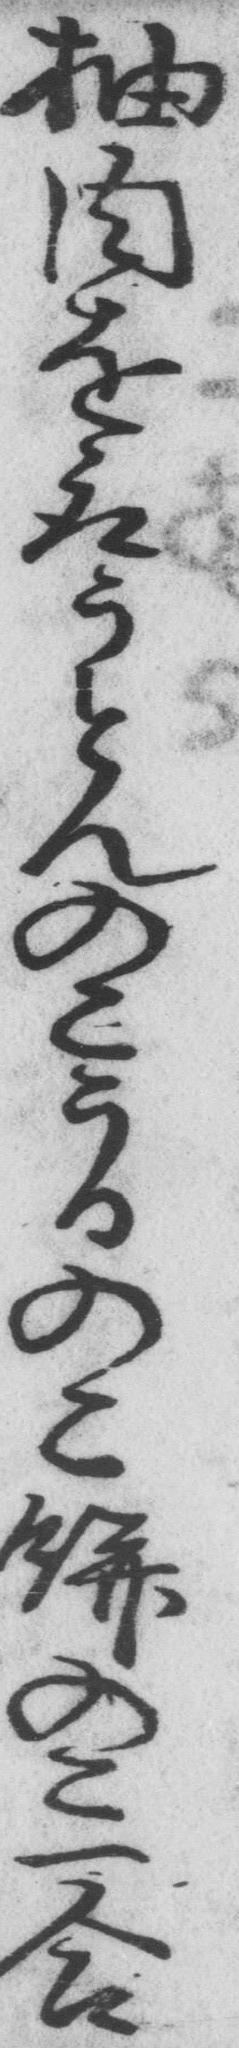柚肉を取うとんのこうるのこ餅のこ一合
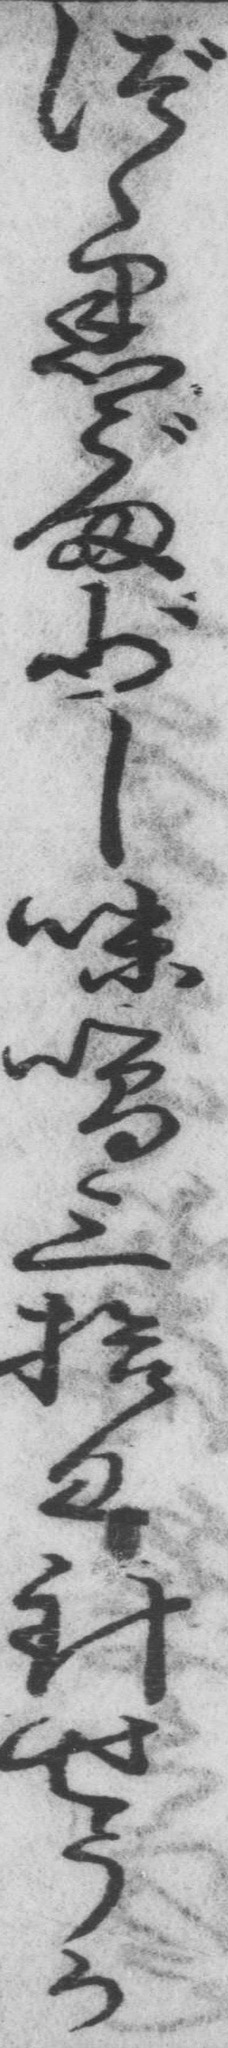づゝ黒ごま少し味噌三拾匁針せうか
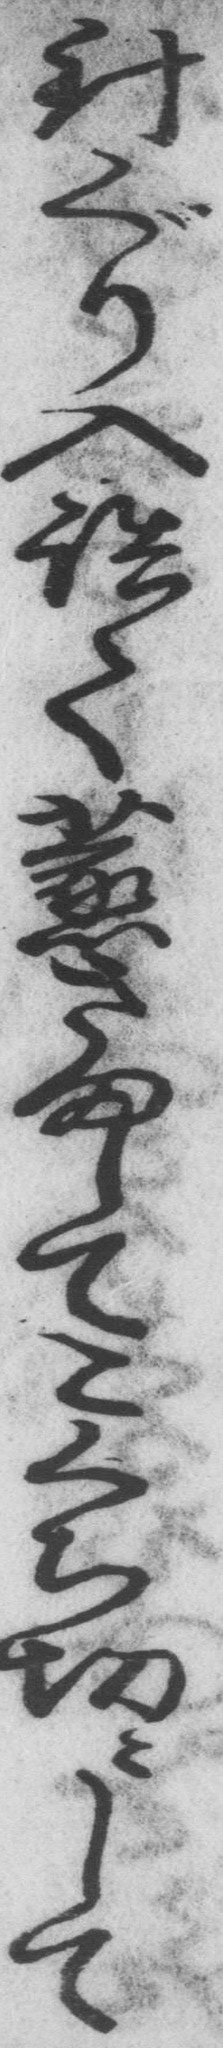針ぐり入詰て蒸さましてこくち切にして
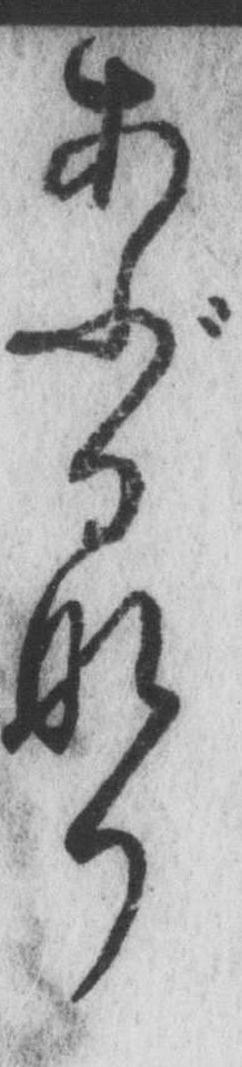あぶるなり
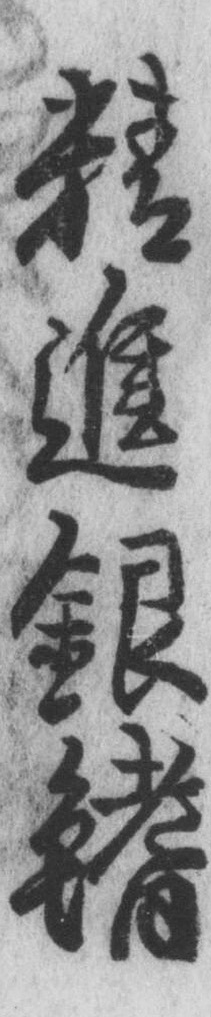精進銀鰭
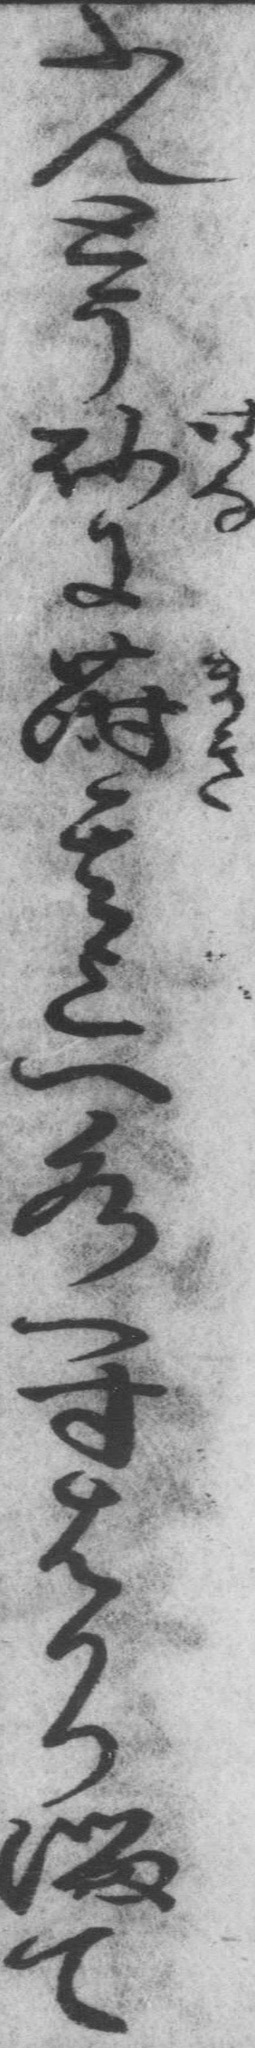ふんとう砂に蒔其上へ水一寸はかり溜て

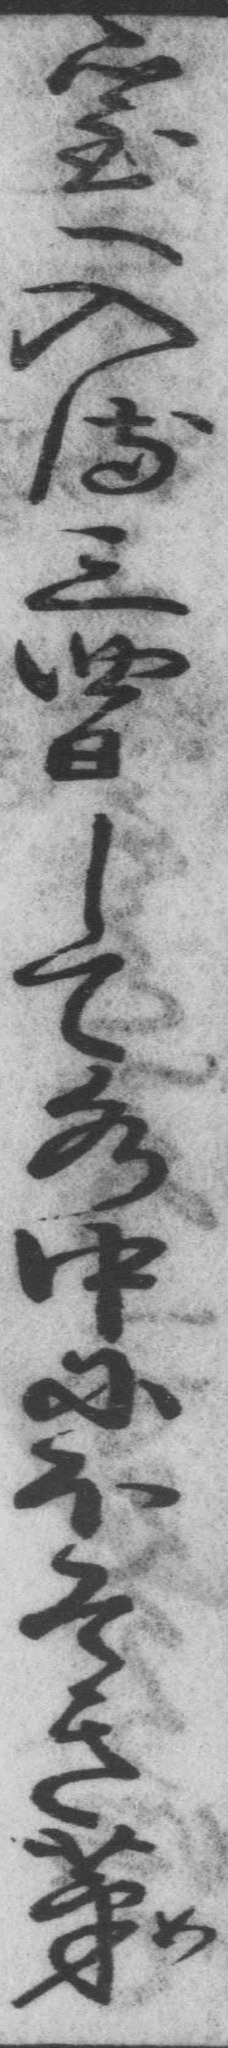室へ入る三四日して水中にほそき芽
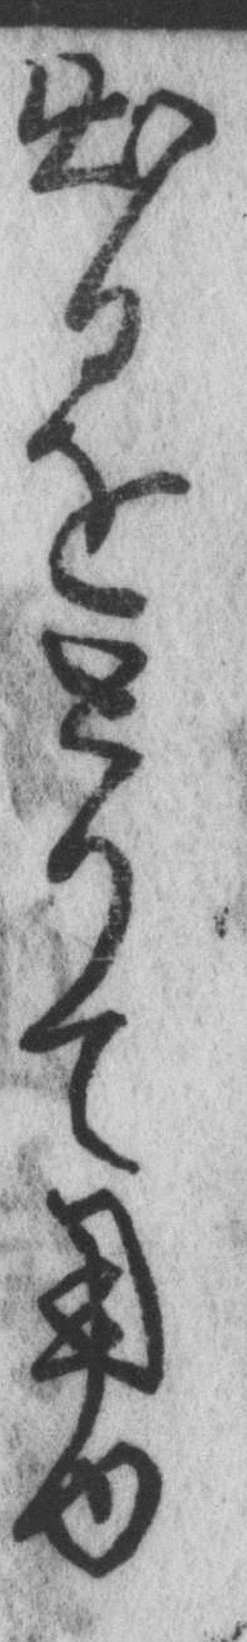出るをとりて用ゆ
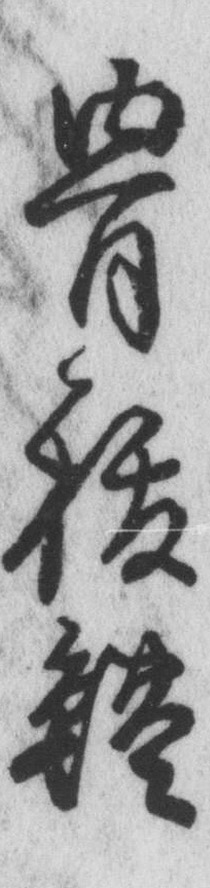骨抜鱧
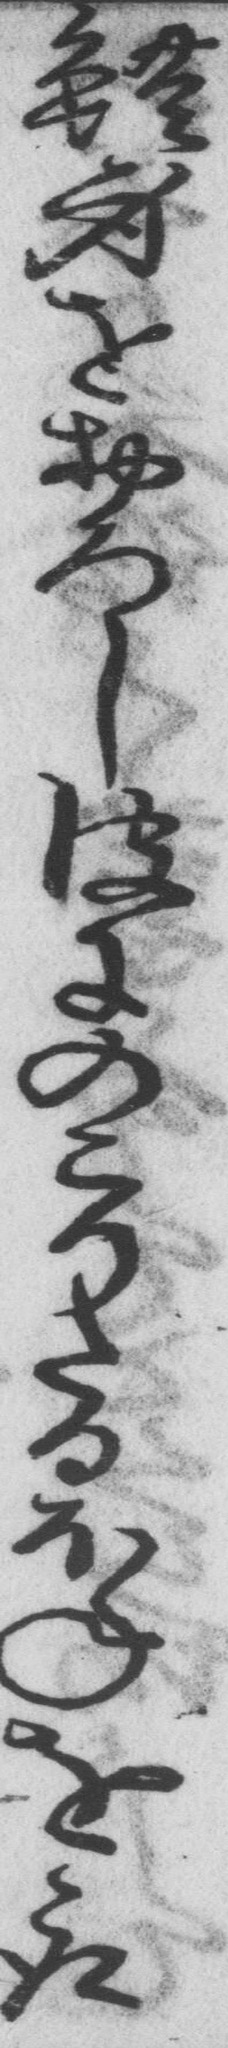鱧身をおろし皮にのこりたるほねを取
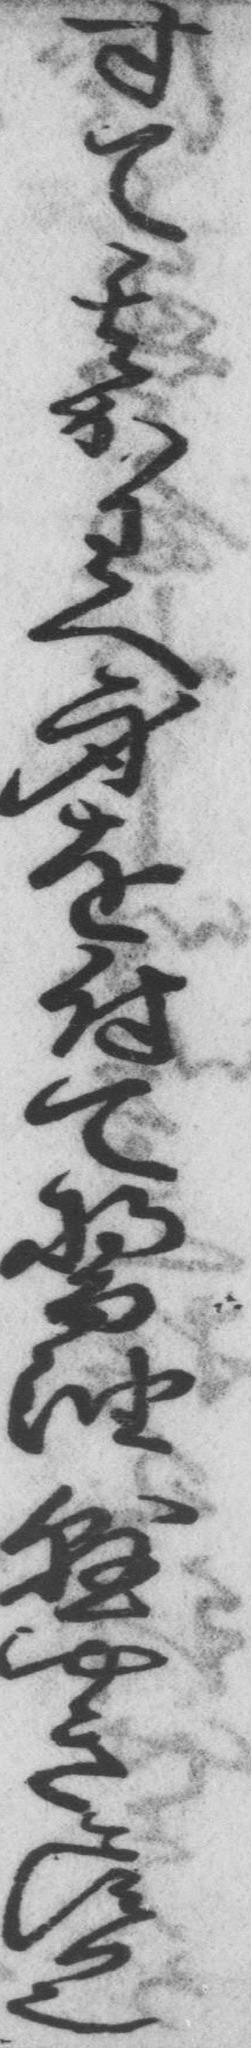すて其かわへ身を付て醤油懸やきにする也
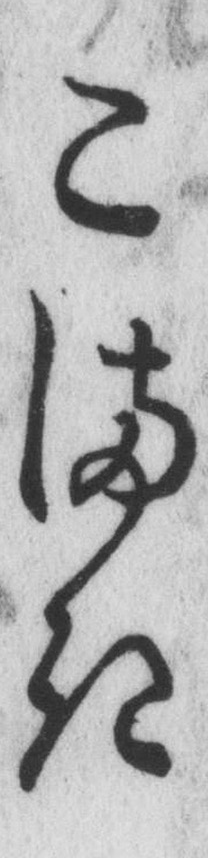こまき
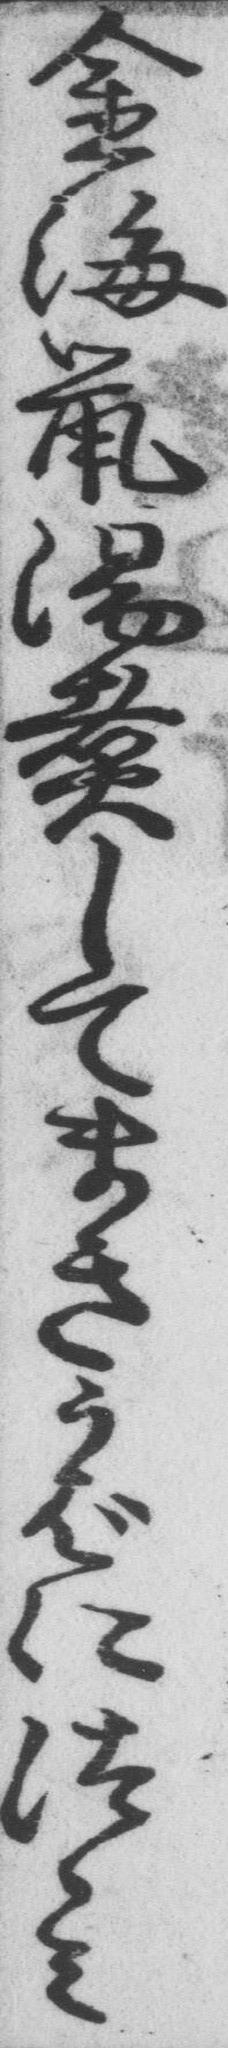金海鼠湯煮してまきうばにつゝみ
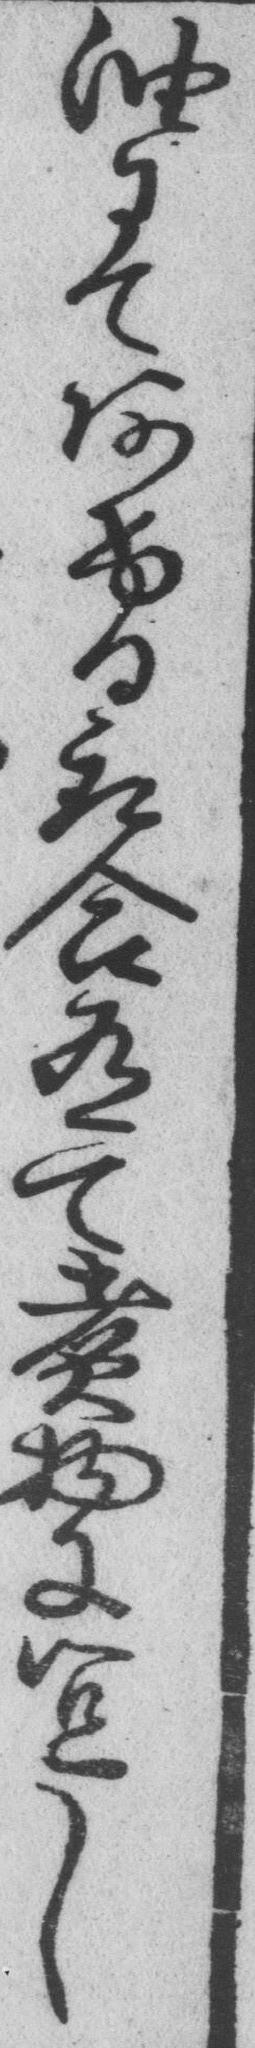油にてあける取合有て煮物に宜し
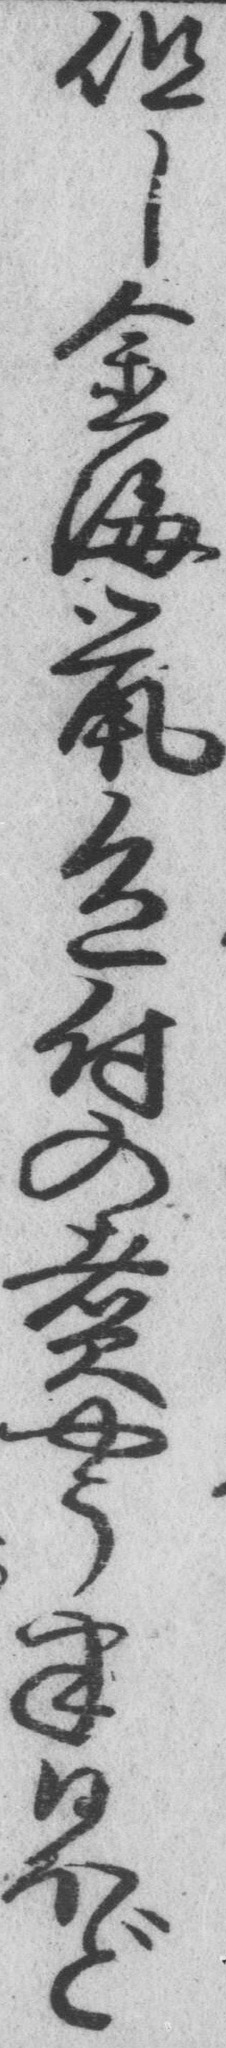但し金海鼠色付の煮やう半日ほど
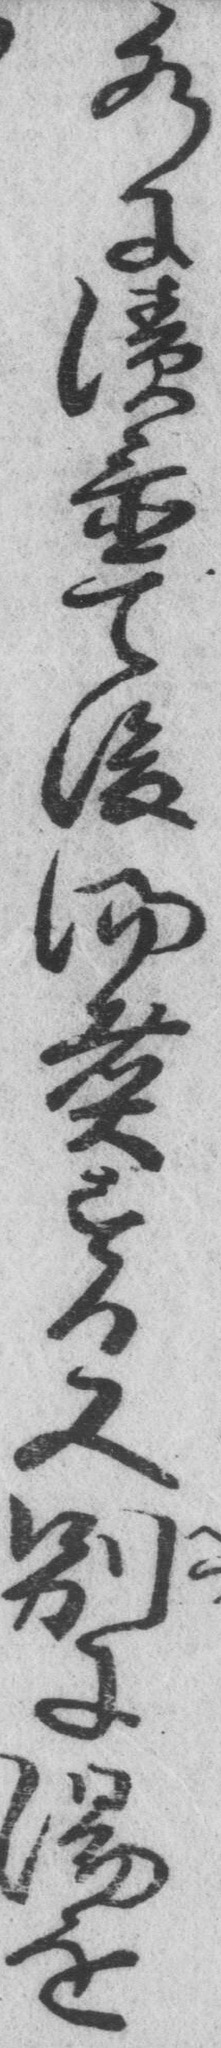水に漬置て後湯煮する又別に湯を
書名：料理山海郷
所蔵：大阪府立大学学術情報センター 国文学研究資料館
